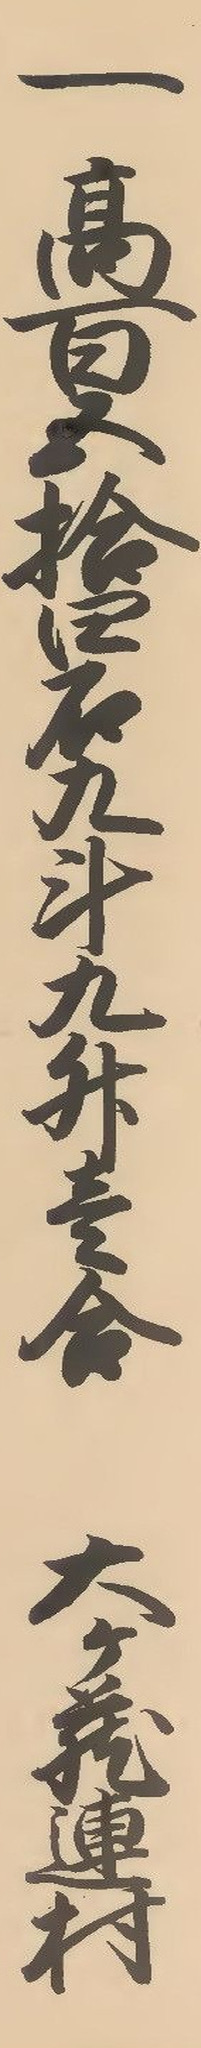一高百五拾四石九斗九升壱合大ヶ蔵連村
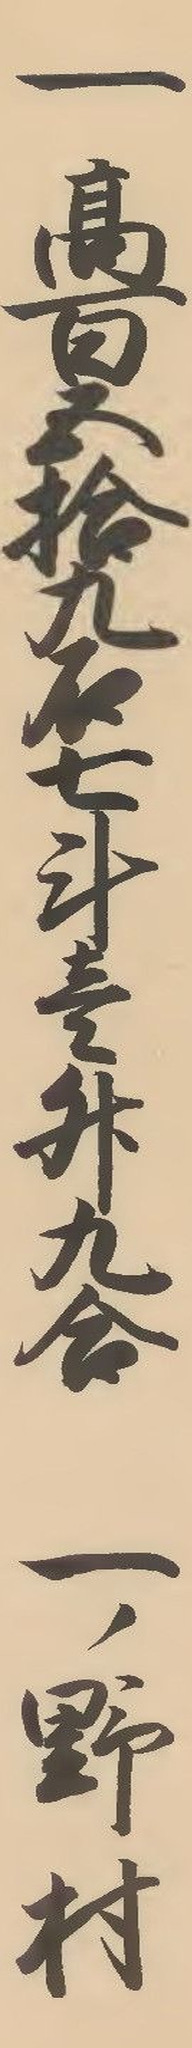一高百五拾九石七斗壱升九合一ノ野村
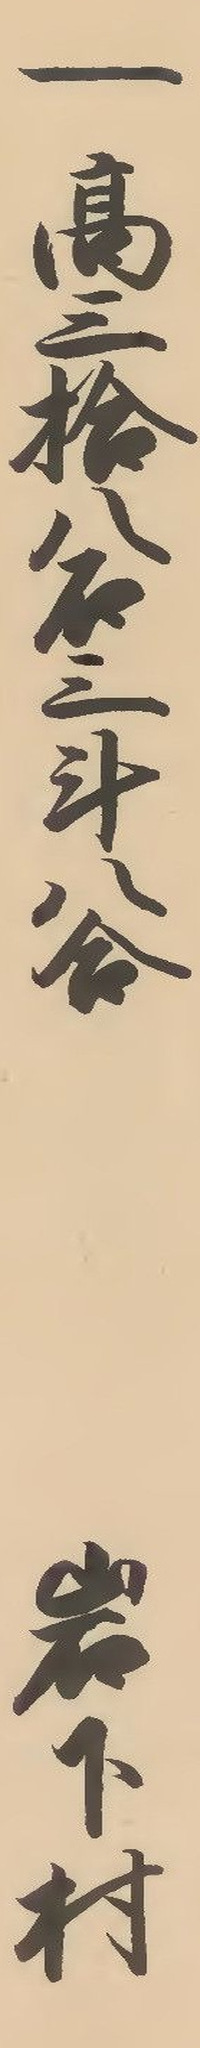一高三拾八石三斗八合岩下村
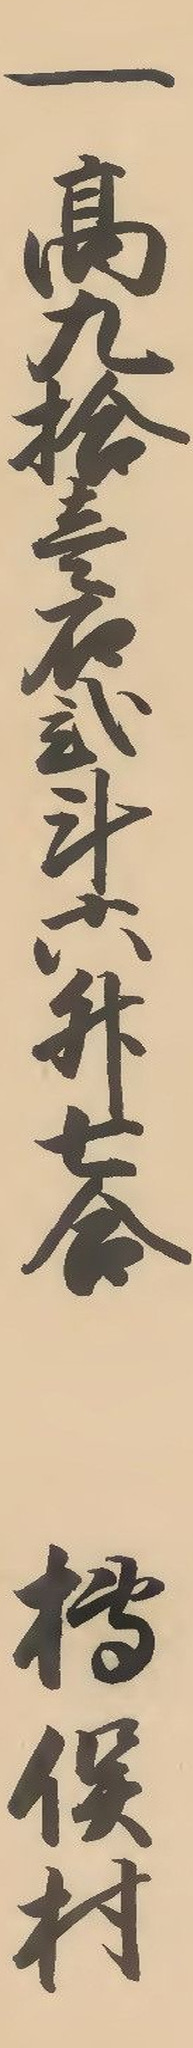一高九拾壱石弐斗六升七合榑俣村

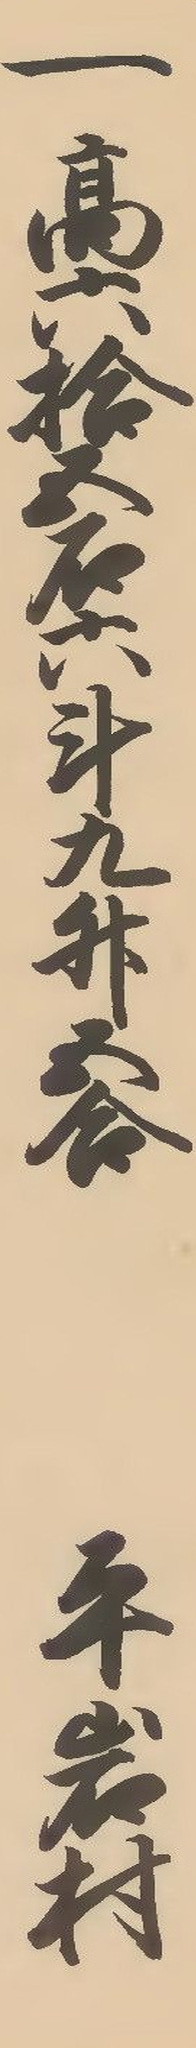一高六拾五石六斗九升五合平岩村
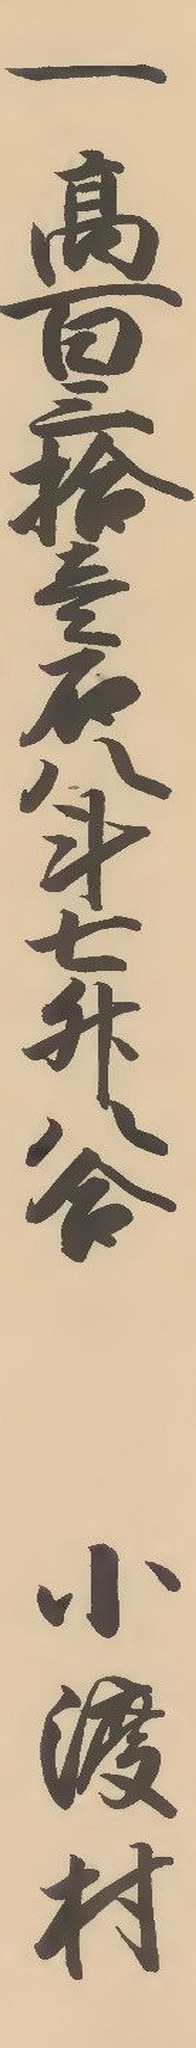一高百三拾壱石八斗七升八合小渡村
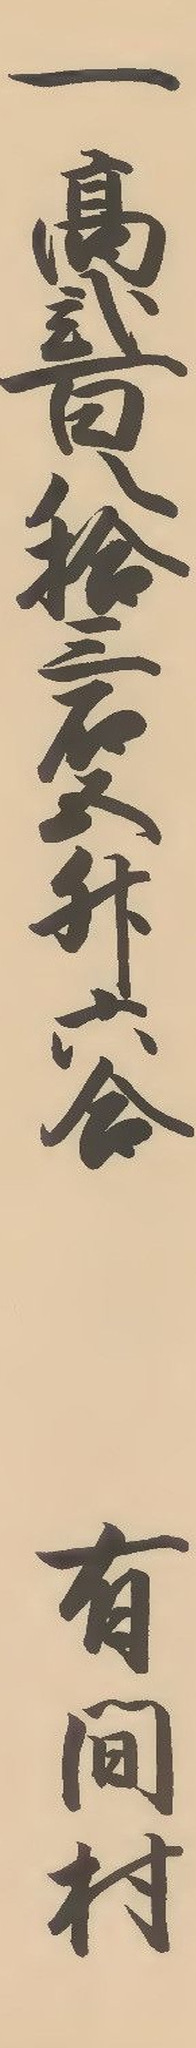一高弐百八拾三石五升六合有間村
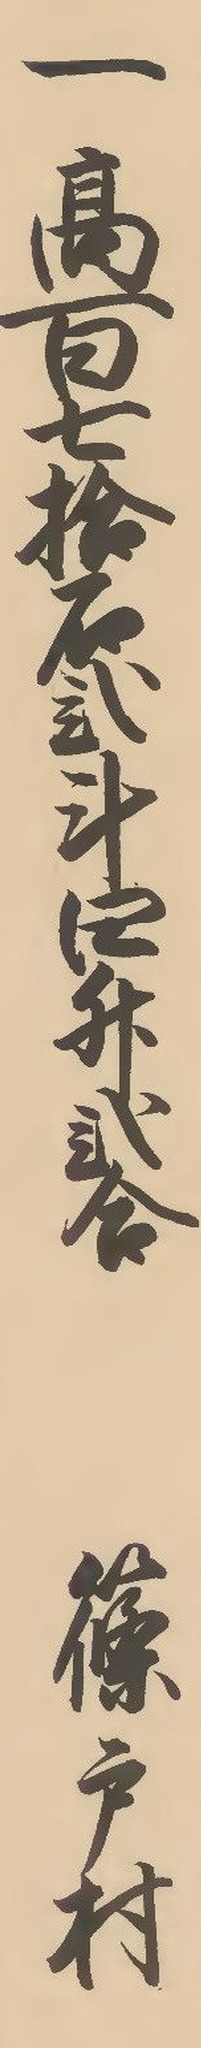一高百七拾石弐斗四升弐合篠戸村
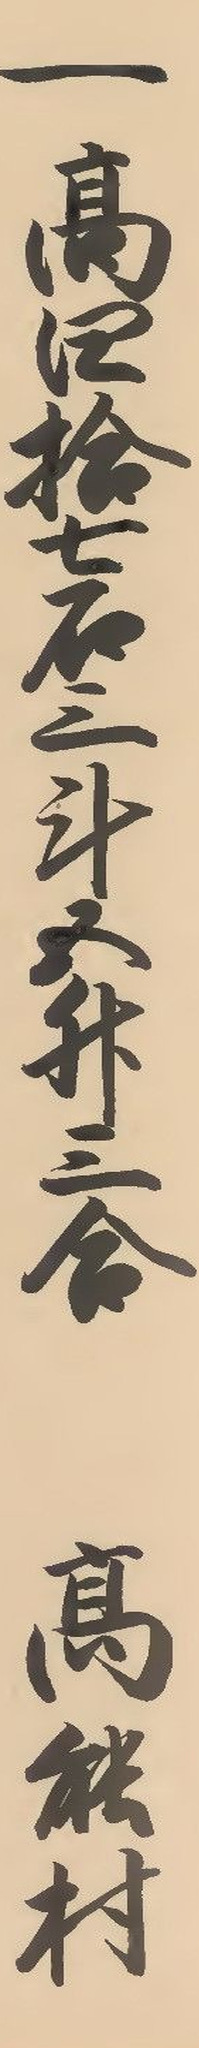一高四拾七石三斗五升三合高能村
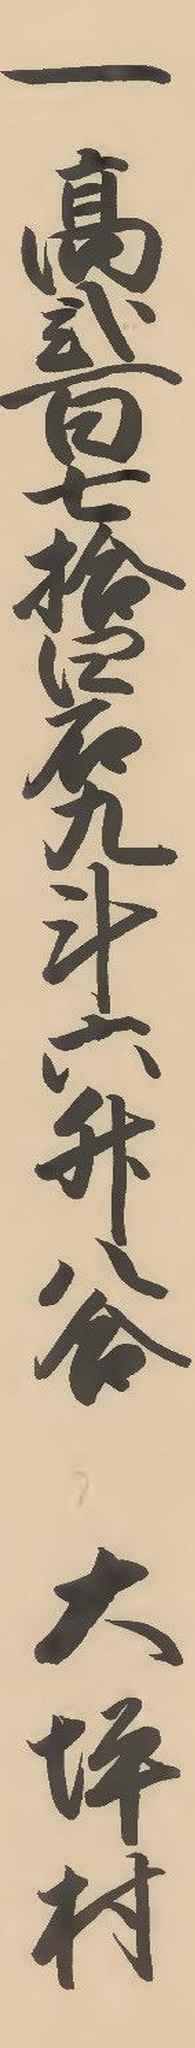一高弐百七拾四石九斗六升八合大坪村
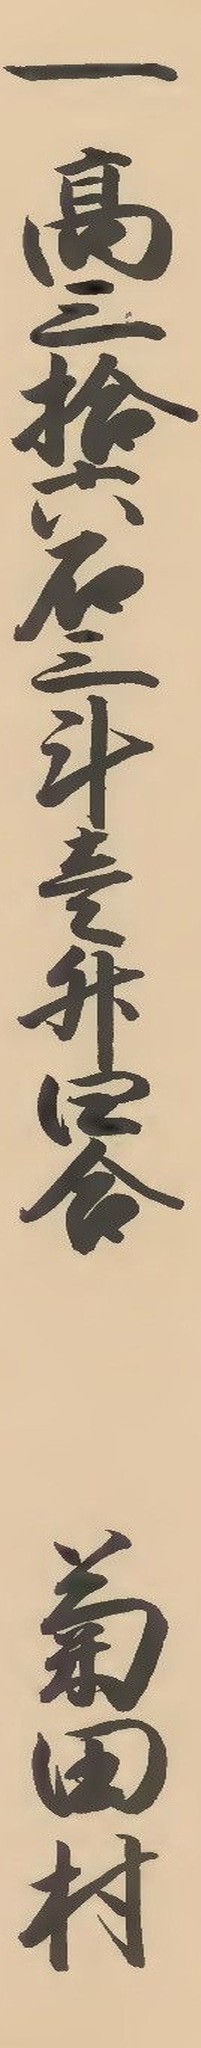一高三拾六石三斗壱升四合菊田村
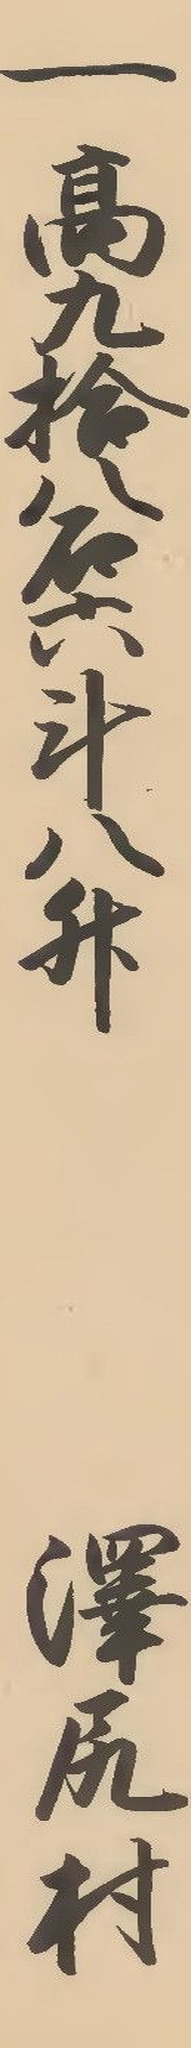一高九拾八石六斗八升沢尻村

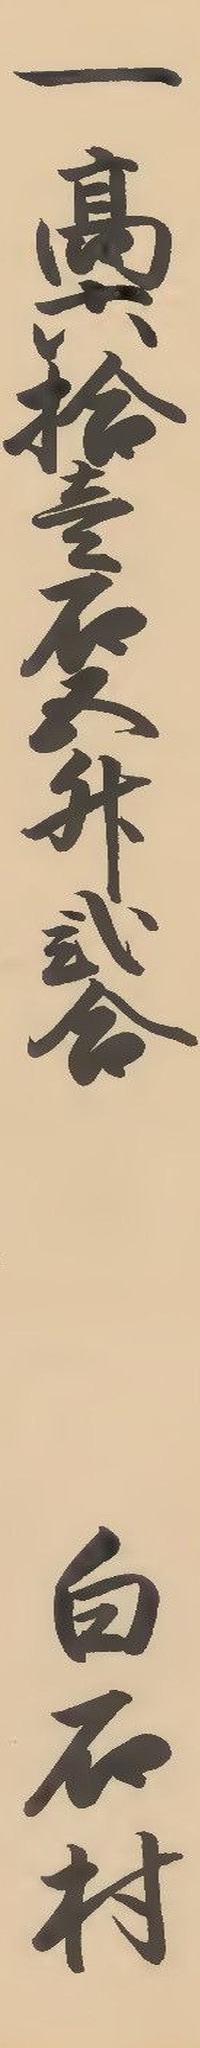一高六拾壱石五升弐合白石村
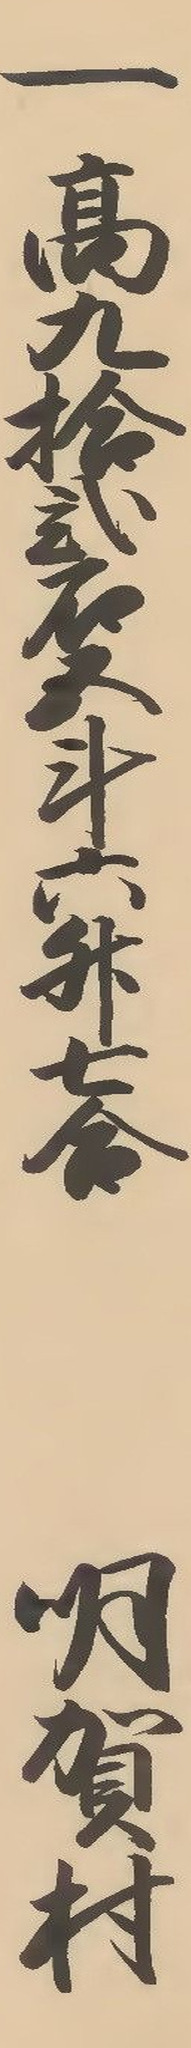一高九拾弐石五斗六升七合明賀村
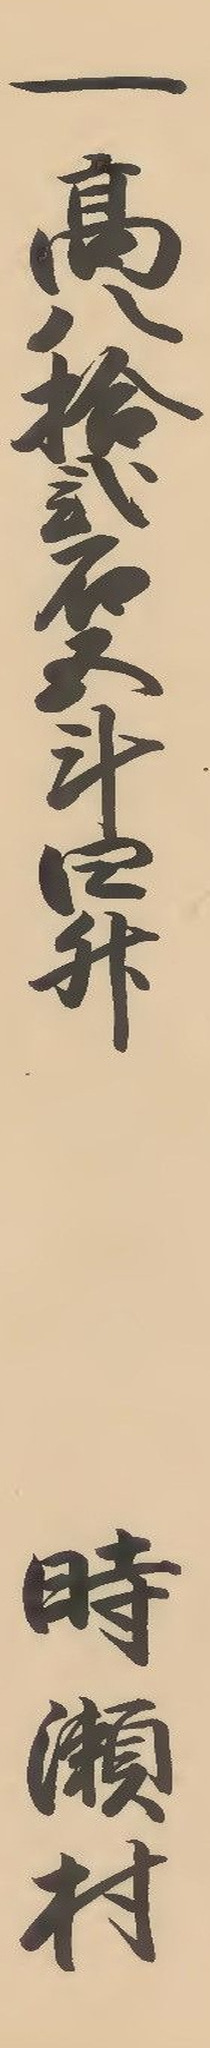一高八拾弐石五斗四升時瀬村
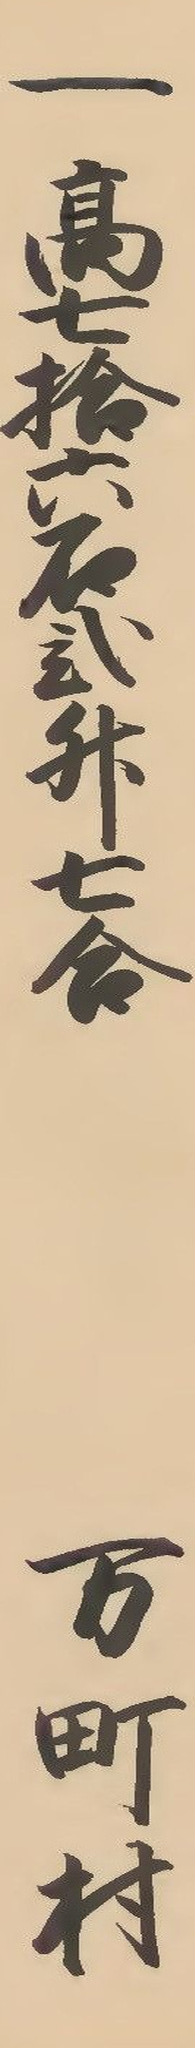一高七拾六石弐升七合万町村
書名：三河国郷帳
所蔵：国立公文書館 National Archives of Japan
